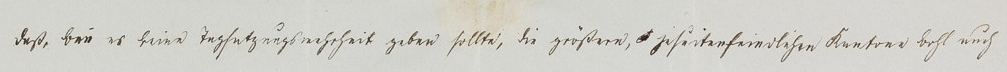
daß, wenn es keine Tagsatzungsmehrheit geben sollte, die größern, K jesuitenfeindlichen Kantone wohl auch
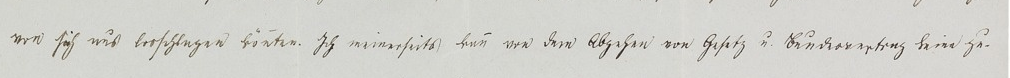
von sich aus losschlagen könnten. Ich meinerseits kann von dem Abgehen von Gesetz u. Bundesvertrag keine gu-
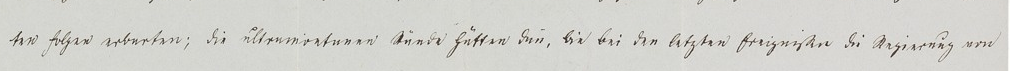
ten Folgen erwarten; die ultramontanen Stände hätten dann, wie bei den letzten Ereignissen die Regierung von
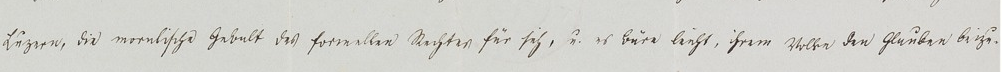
Luzern, die moralische Gewalt des formellen Rechtes für sich, u. es wäre leicht, ihrem Volke den Glauben beizu-
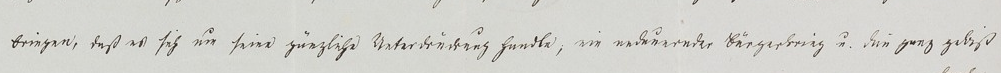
bringen, daß es sich um seine gänzliche Unterdrückung handle; ein andauernder Bürgerkrieg u. dann ganz gewiß
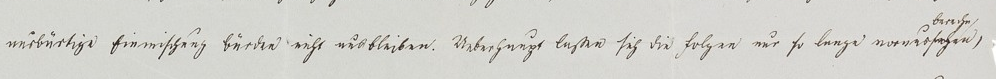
auswärtige Einmischung würden nicht ausbleiben. Ueberhaupt lassen sich die Folgen nur so lange voraussehberechnen,
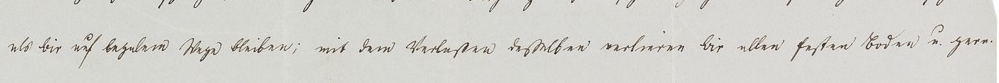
als wir auf legalem Wege bleiben; mit dem Verlassen desselben verlieren wir allen festen Boden u. gera-
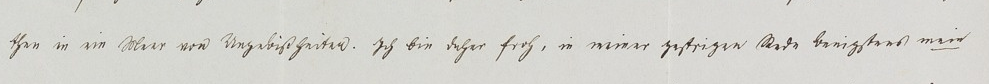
then in ein Meer von Ungewißheiten. Ich bin daher froh, in meiner gestrigen Rede wenigstens mein
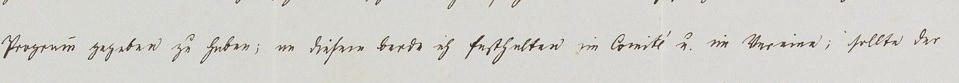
Programm gegeben zu haben; an diesem werde ich festhalten im Comité u. im Vereine; sollte der
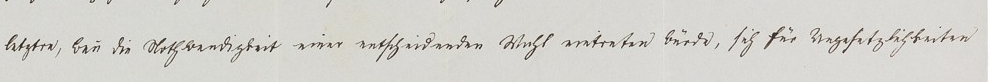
letztre, wenn die Nothwendigkeit einer entscheidenden Wahl eintreten würde, sich für Ungesetzlichkeiten
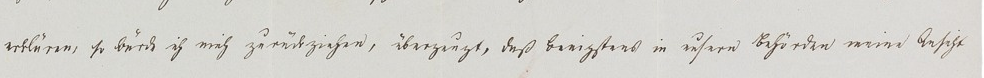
erklären, so würde ich mich zurückziehen, überzeugt, daß wenigstens in unsern Behörden meine Ansicht
